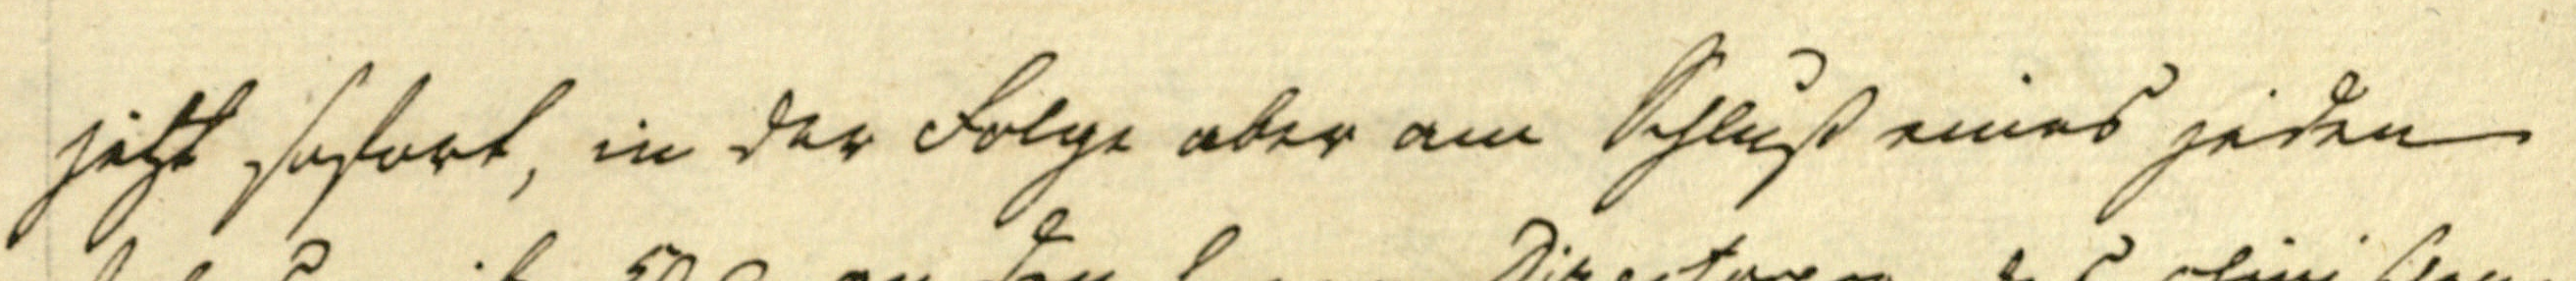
jetzt sofort, in der Folge aber am Schluß eines jeden
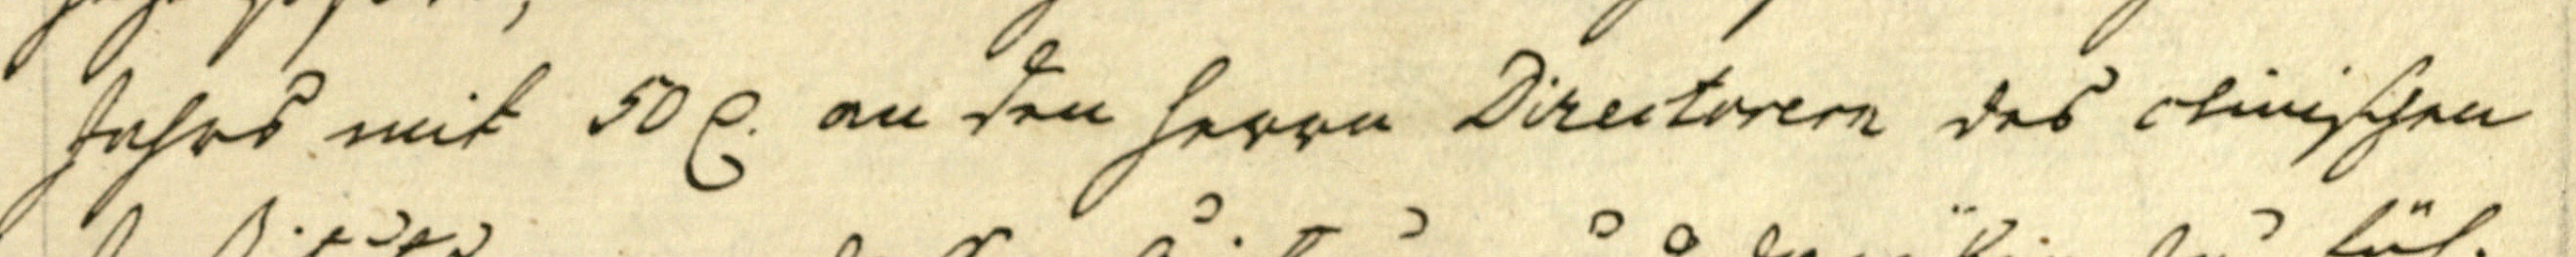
Jahres mit 50 l. an den Herrn Directorem des clinischen
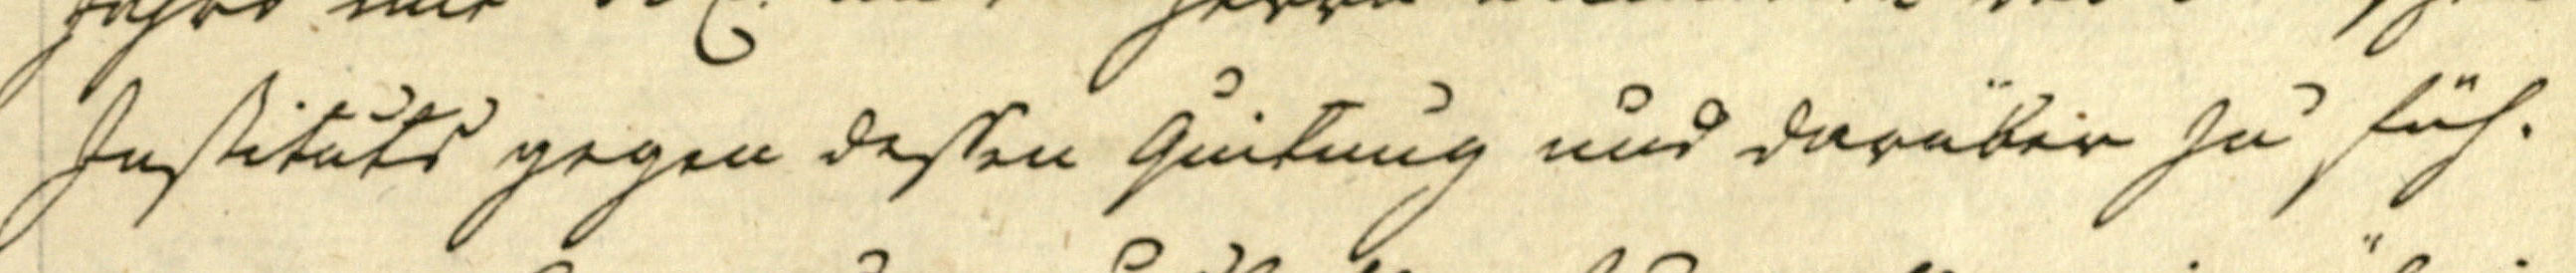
Instituts gegen dessen Quitung und darüber zu füh¬
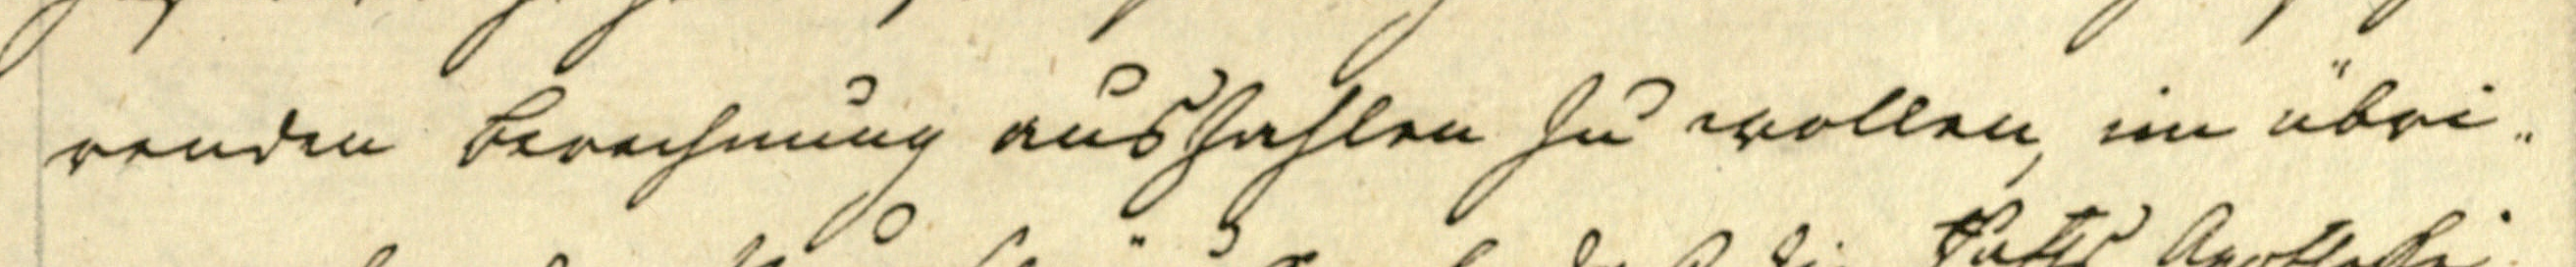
renden Berechnung auszahlen zu wollen im übri¬
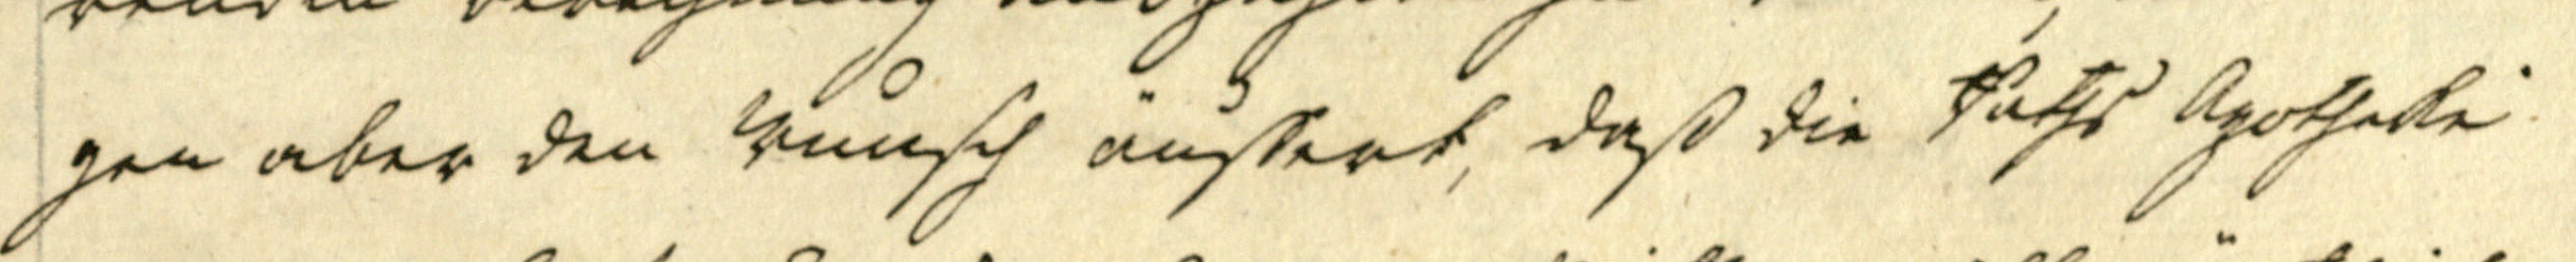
gen aber den Wunsch äussert, daß die Raths Apotheke
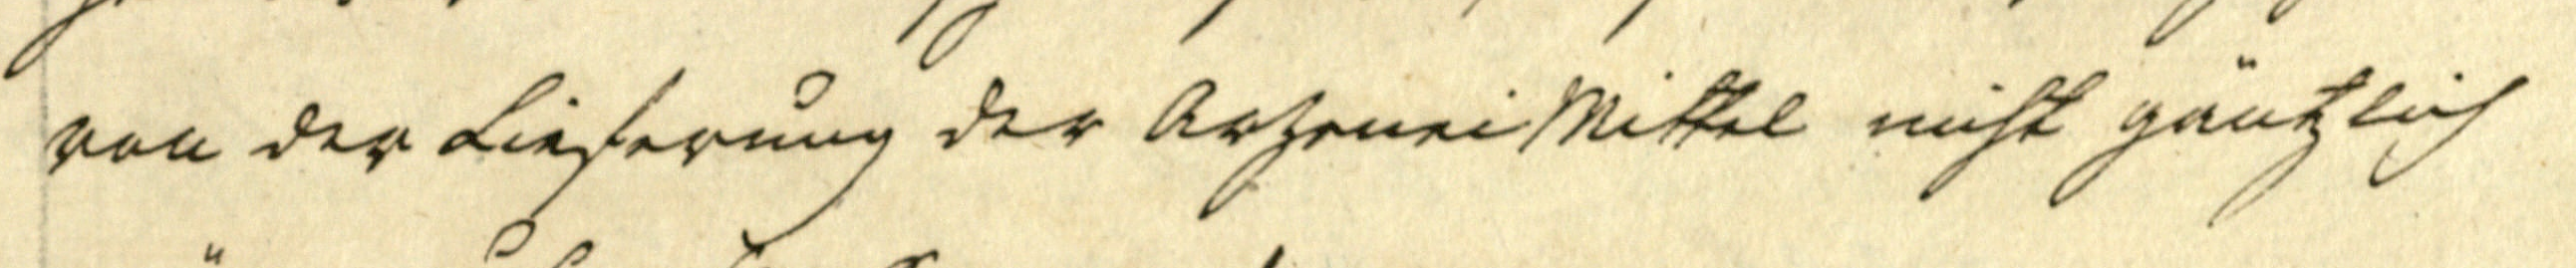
von der Lieferung der ArzeneiMittel nicht gäntzlich
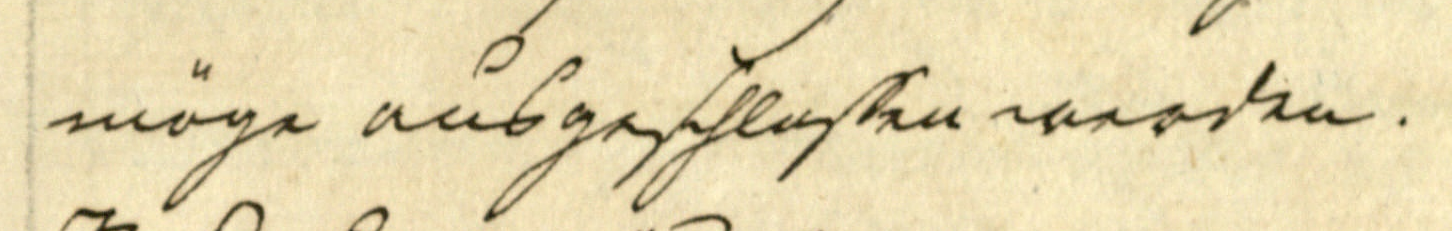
möge ausgeschlossen werden.
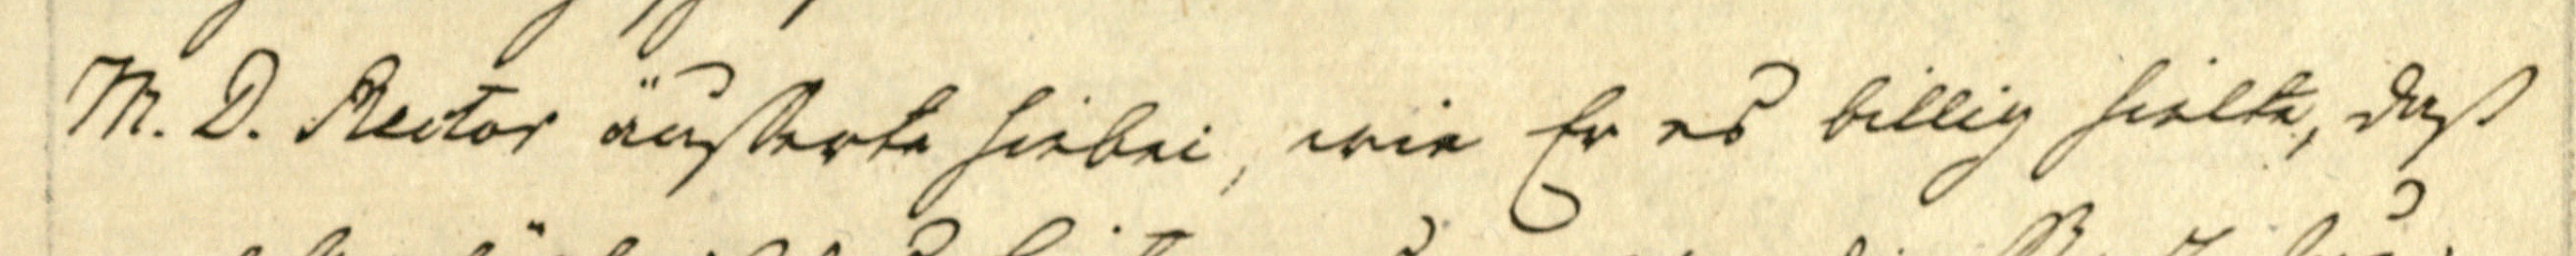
M. D. Rector äusserte hiebei, wie Er es billig hielte, daß
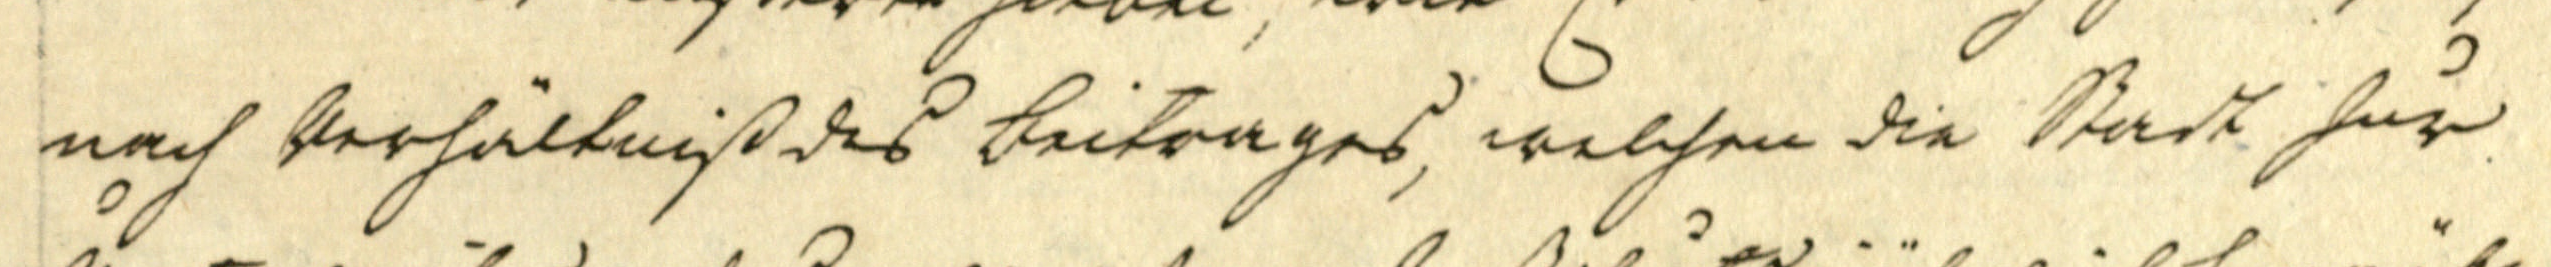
nach Verhältniß des Beitrages, welchen die Stadt zur
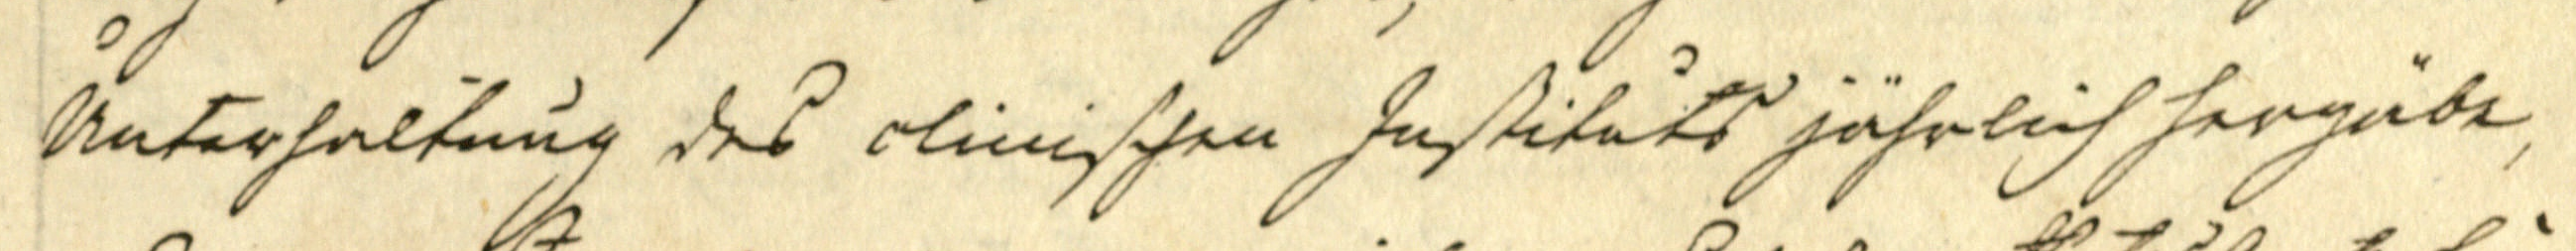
Unterhaltung des clinischen Instituts jährlich hergäbe
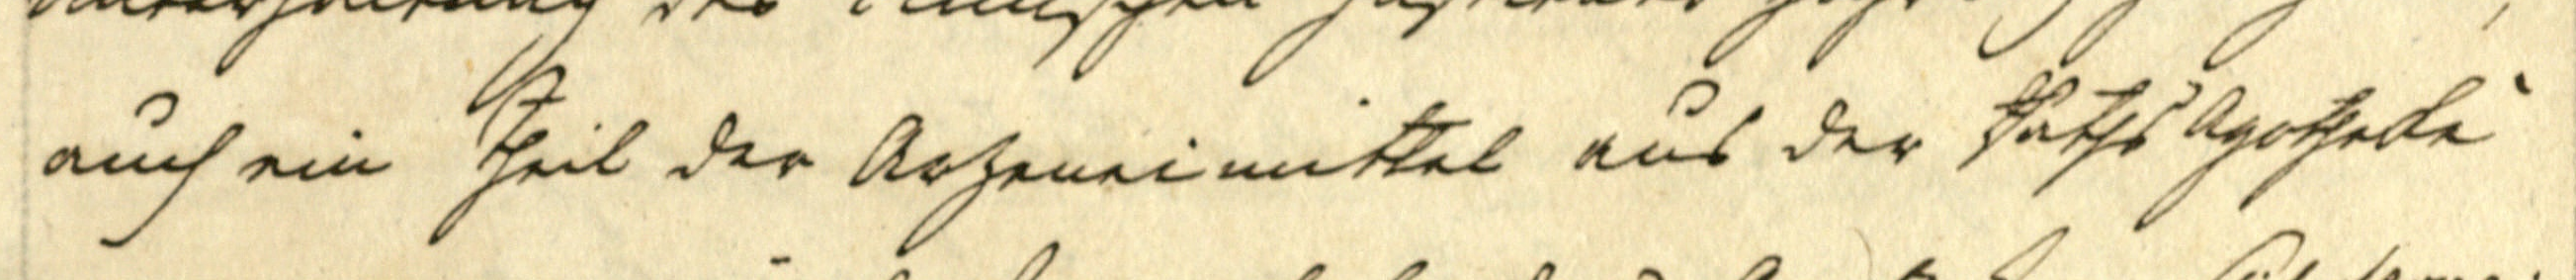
auch ein Theil der Arzeneimittel aus der Raths Apotheke
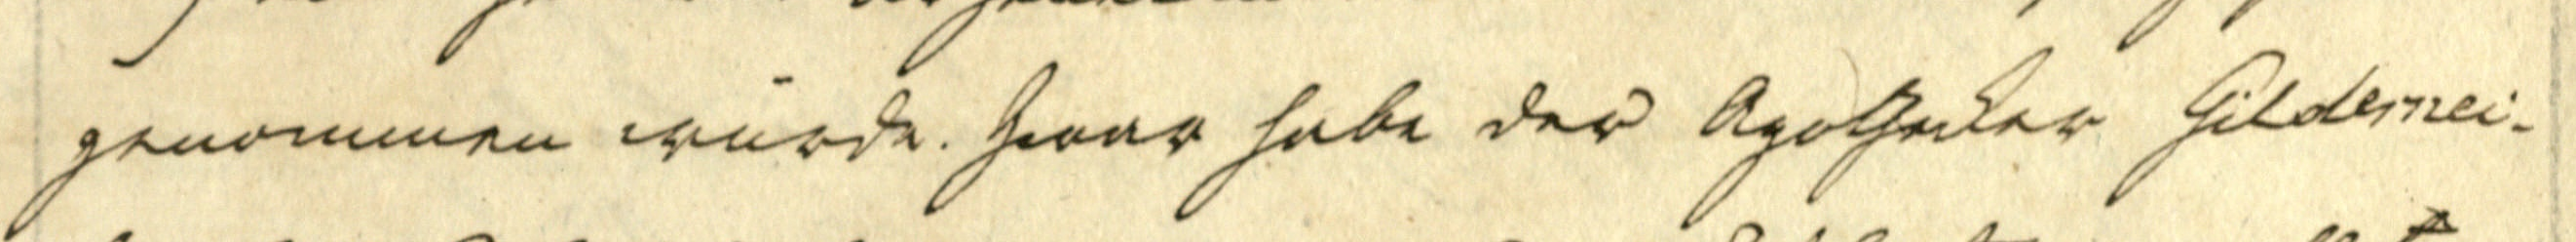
genommen würde. Zwar habe der Apothecker Gildemei¬
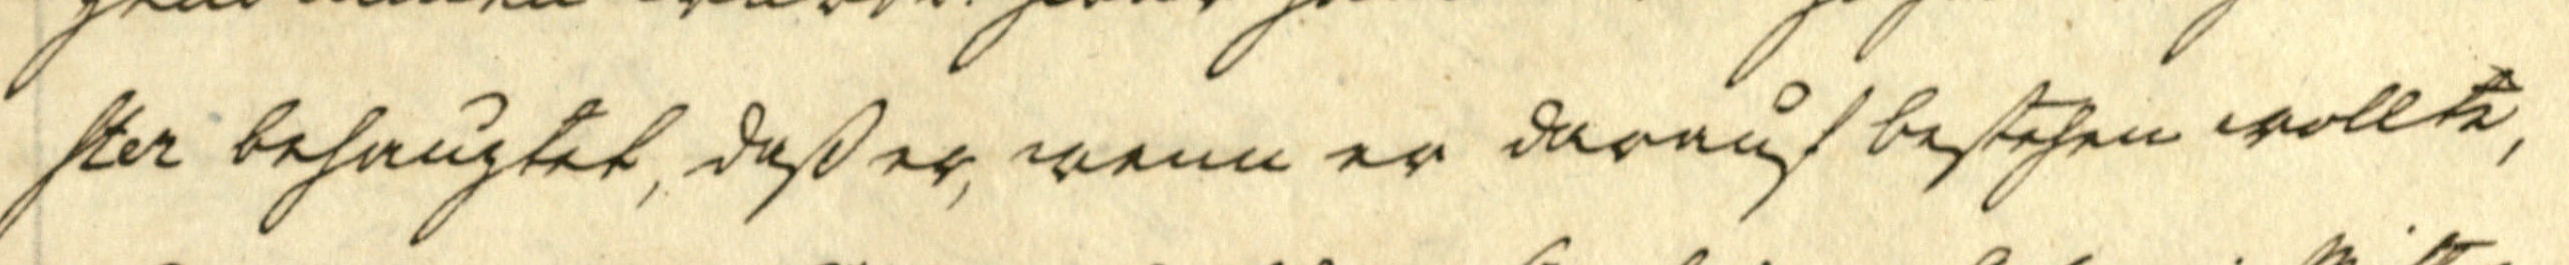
ster behauptet, daß er, wenn er darauf bestehen wollte,
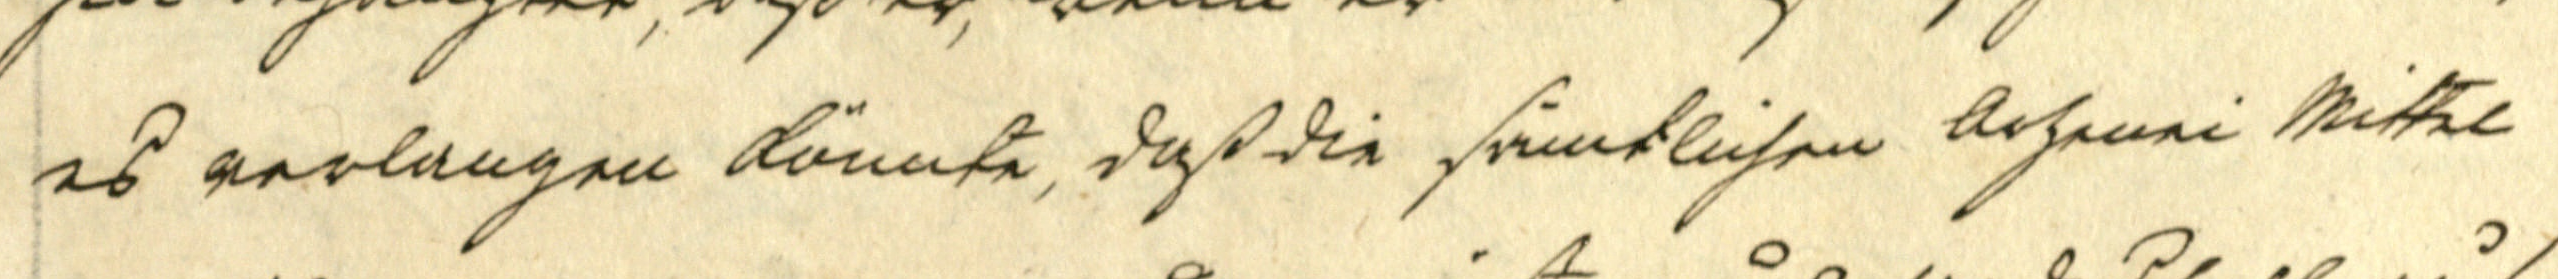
es verlangen könnte, daß die sämtlichen Arzenei Mittel
